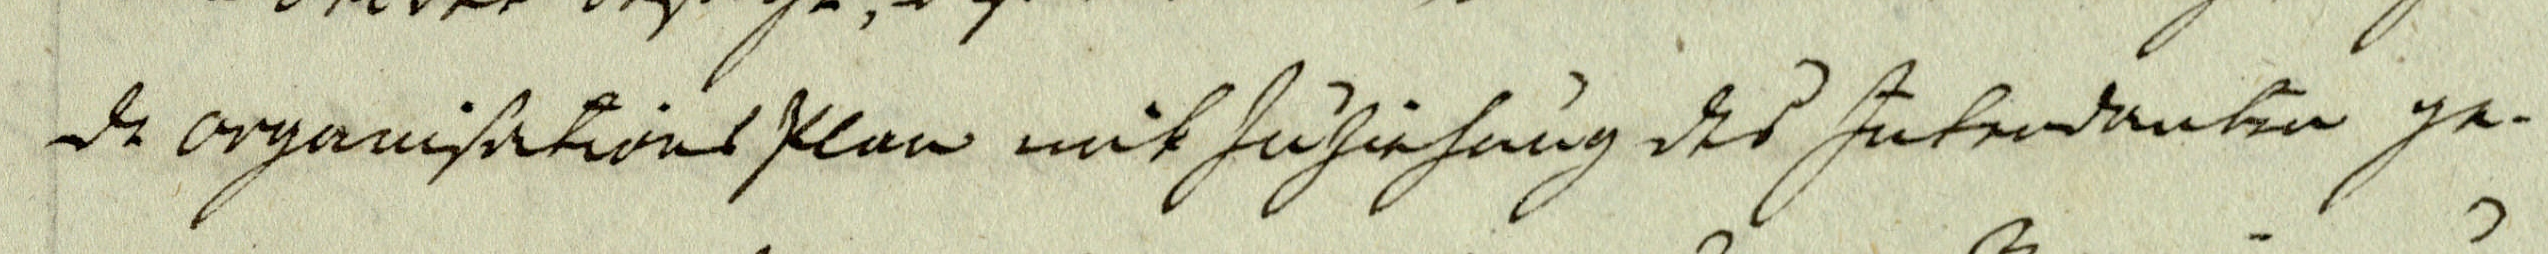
de organisations Plan mit Zuziehung des Intendanten ge¬
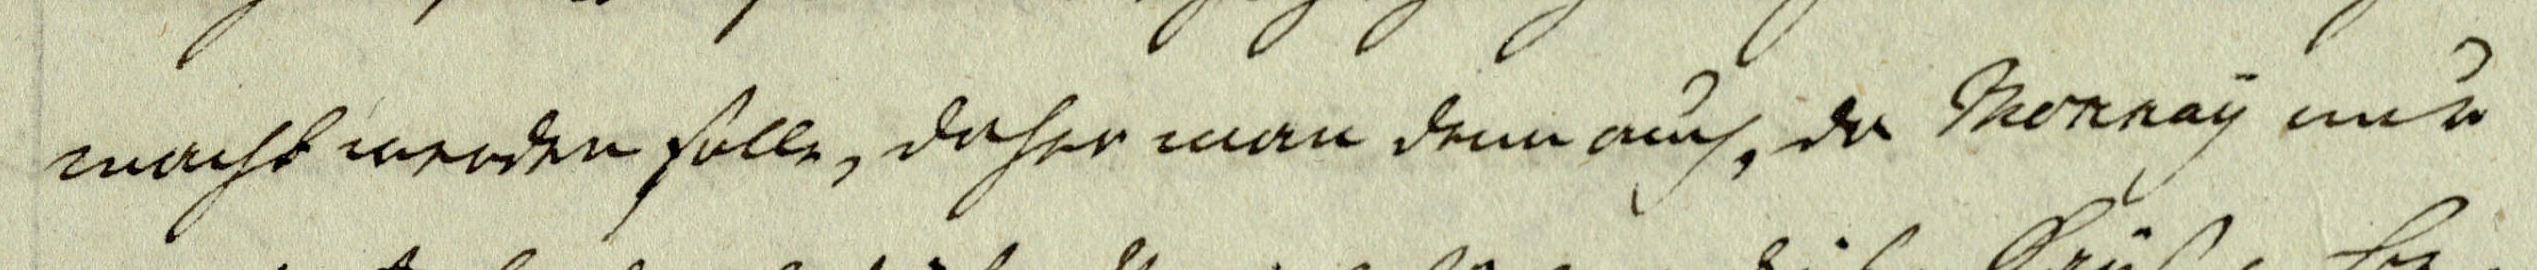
macht werden solle, daher man denn auch, da Monnaÿ nur
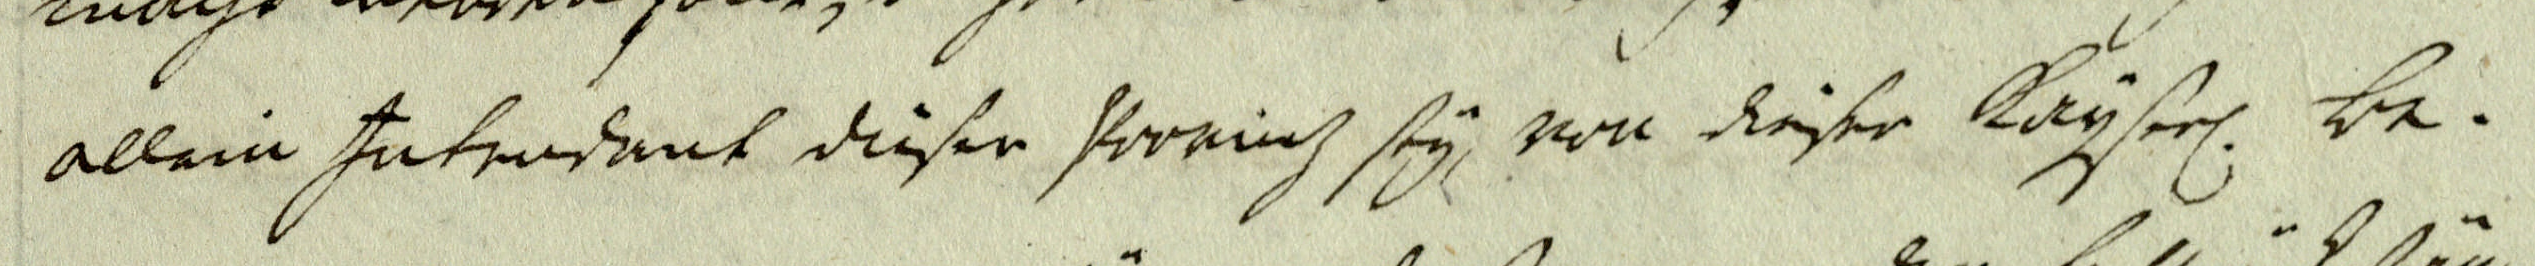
allein Intendant dieser Provinz seÿ, von dieser Kaÿserl. Be¬
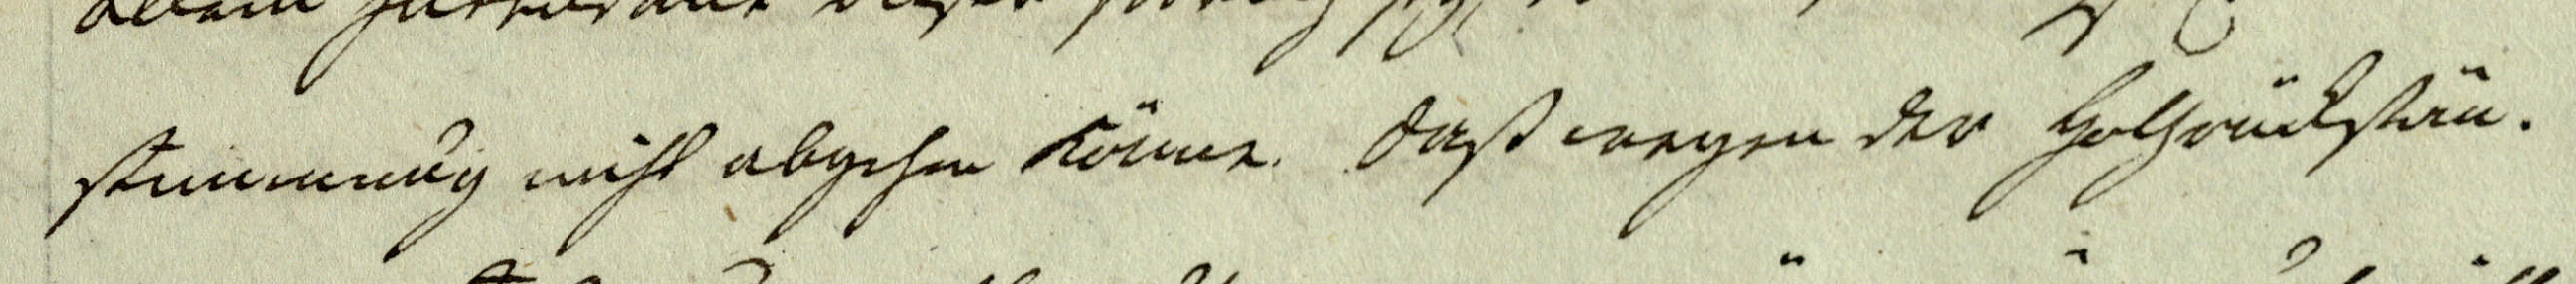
stimmung nicht abgehen könne. daß wegen der Holzrückstän¬
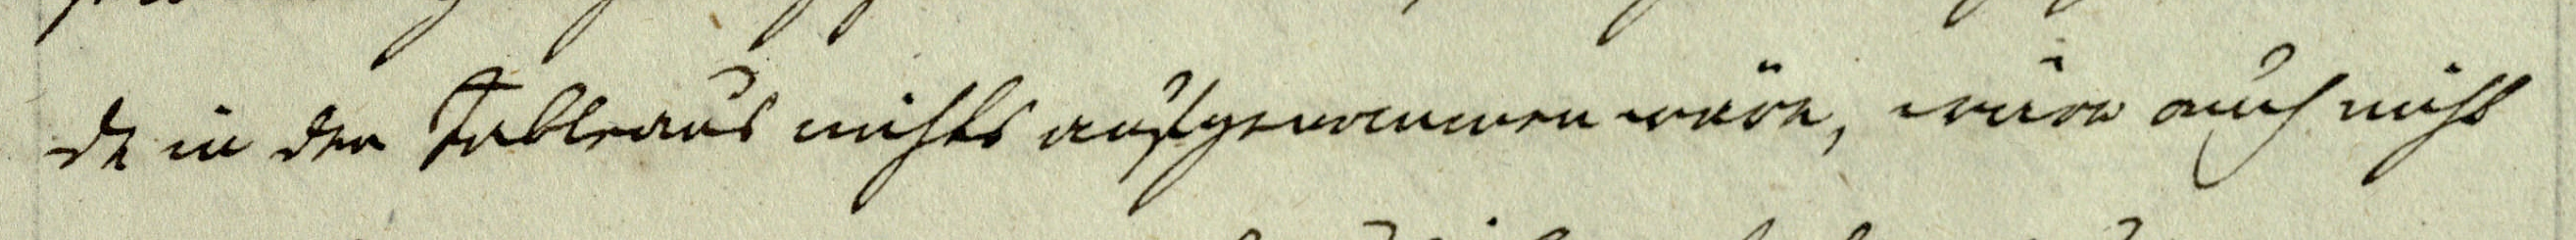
de in den Tableaus nichts aufgenommen wäre, wäre auch nicht
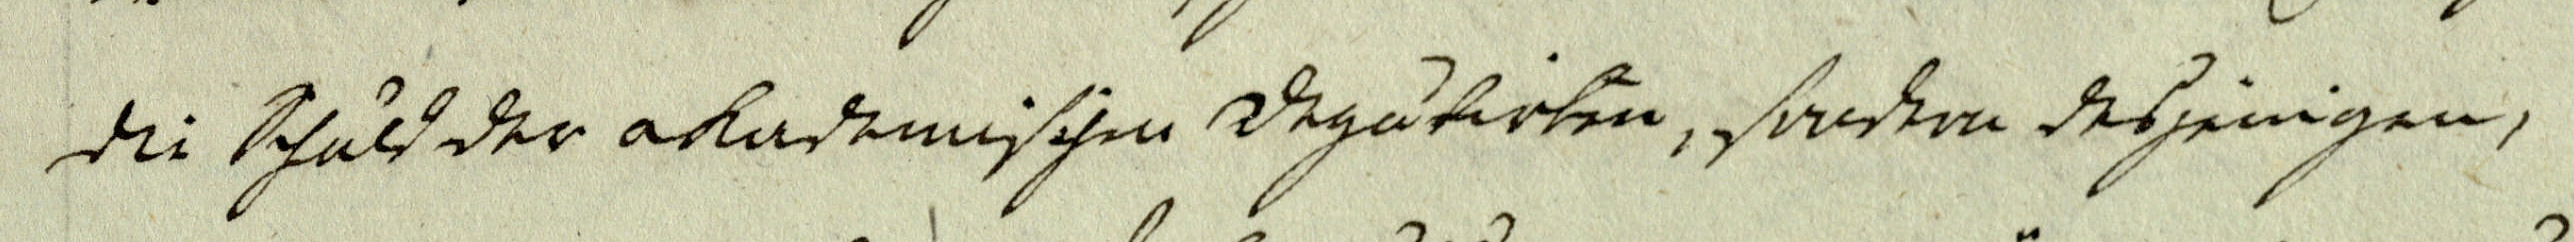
die Schuld der akademischen Deputirten, sondern desjenigen,
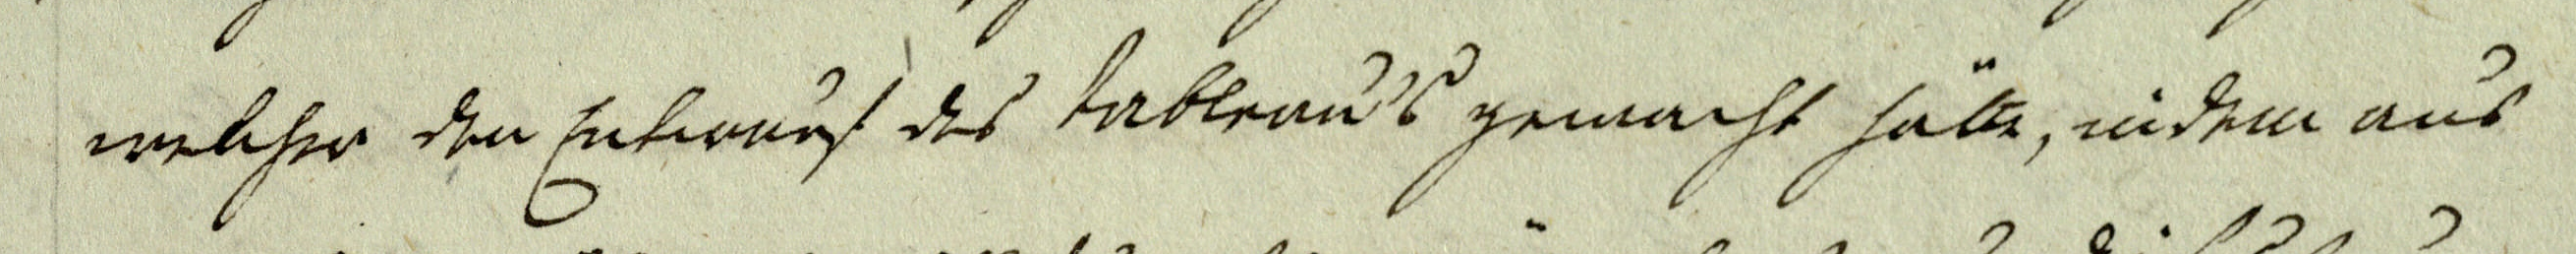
welcher den Entwurf des Tableau s gemacht habe, indem aus
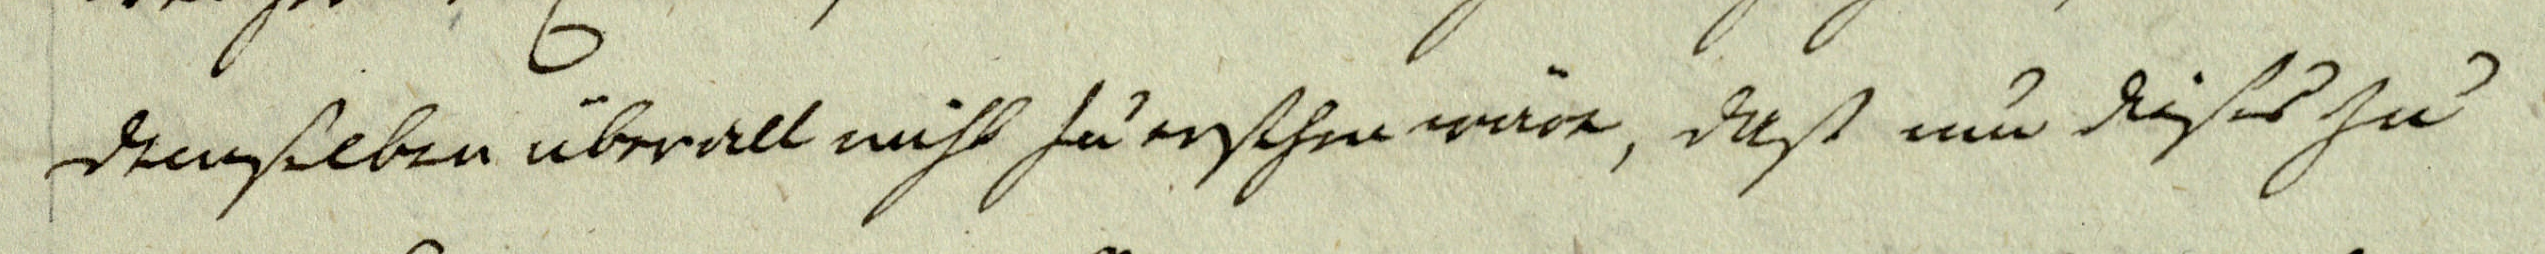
demselben überall nicht zu ersehen wäre, daß um dieses zu
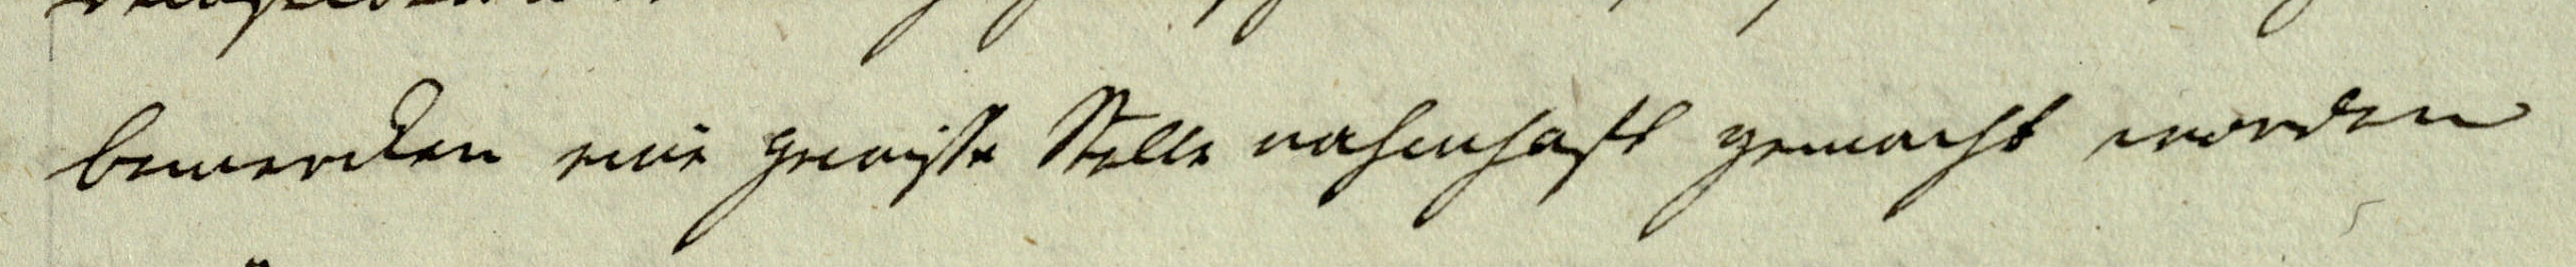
bemercken eine gewisse Stelle nahmhaft gemacht worden
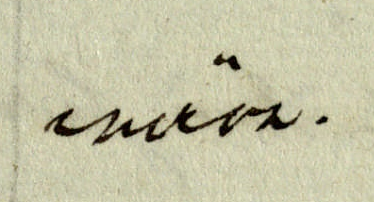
wäre.
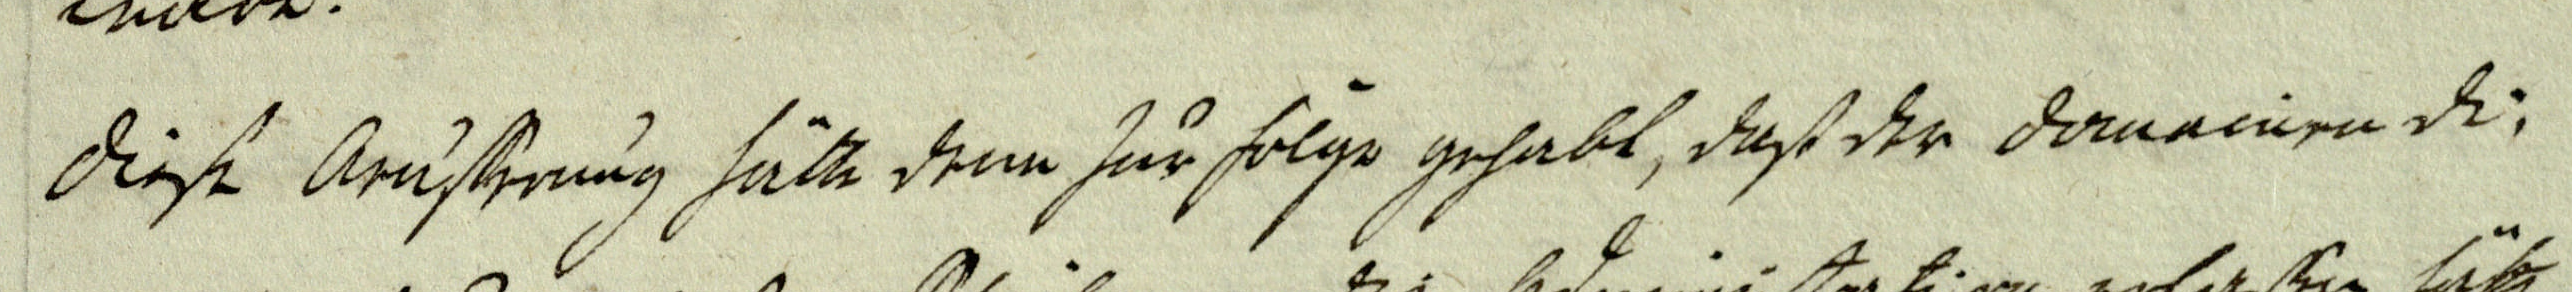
Diese Aeusserung hätte denn zur Folge gehabt, daß der Domainendi¬
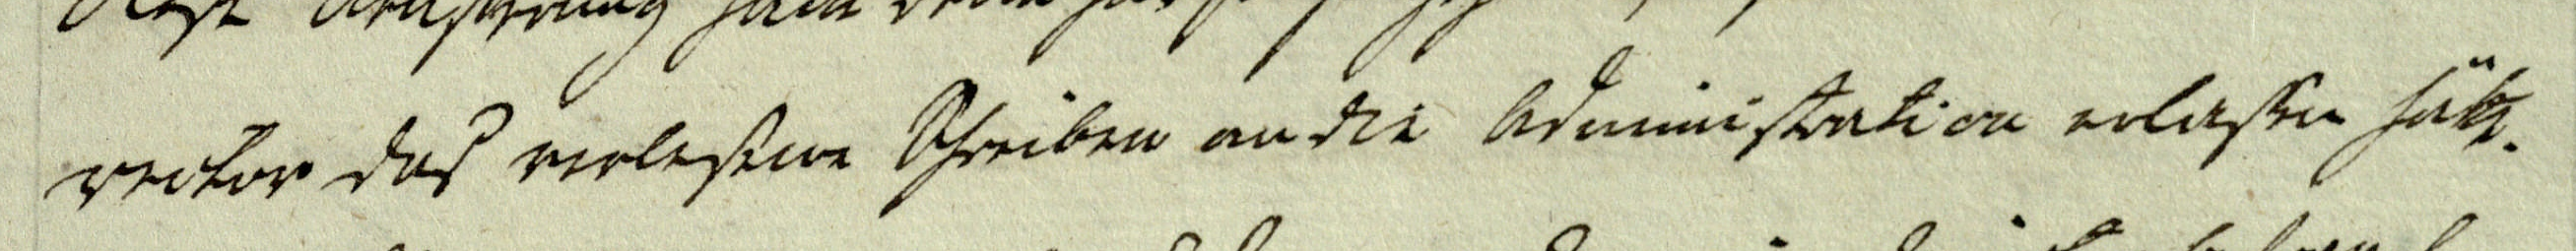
rector das verlesene Schreiben an die Administration erlassen hätte.
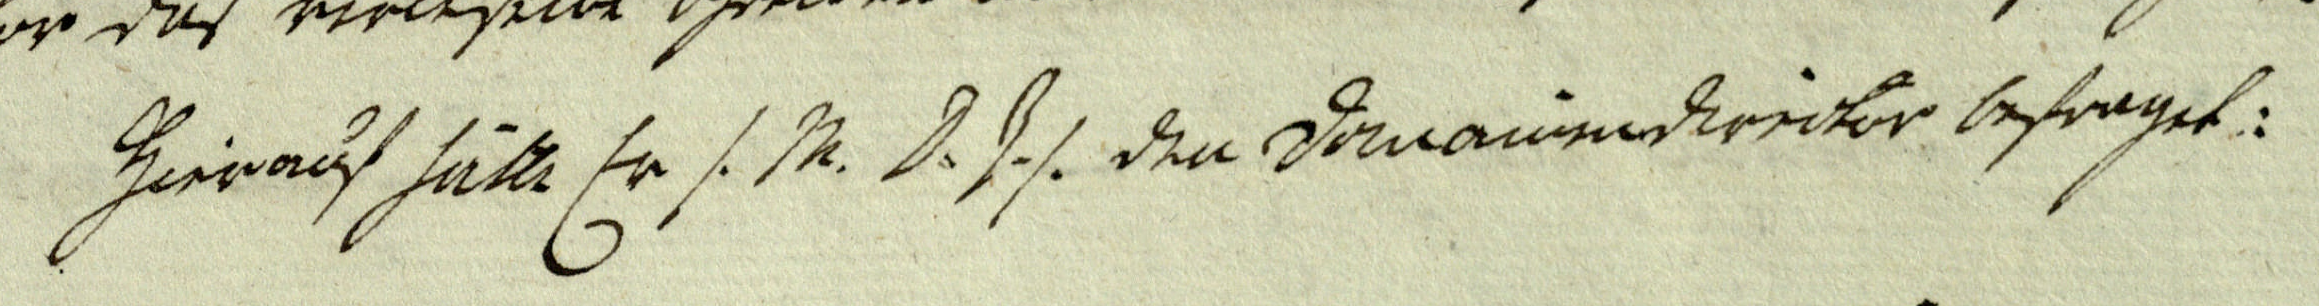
Hierauf hätte Er /. M. D. R./. den Domainendirector befraget,
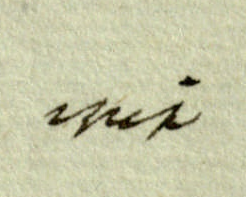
wie
